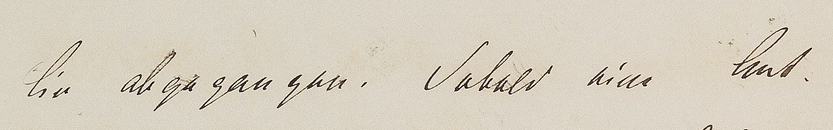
lin abgegangen. Sobald eine Ant-
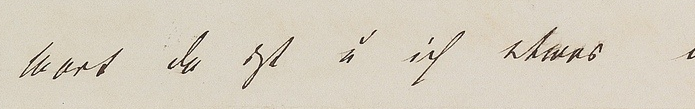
wort da ist u ich etwas
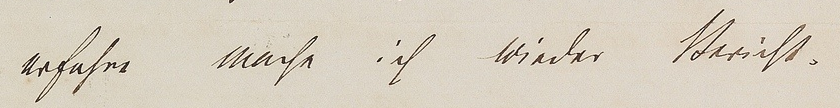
erfahre mache ich wieder Bericht.
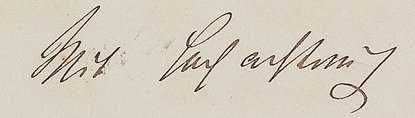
Mit Hochachtung
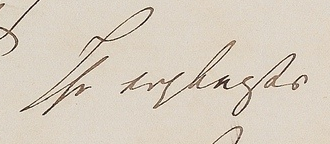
Ihr ergbnstr
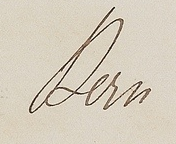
Welti
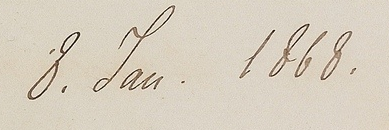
8. Jan. 1868.
